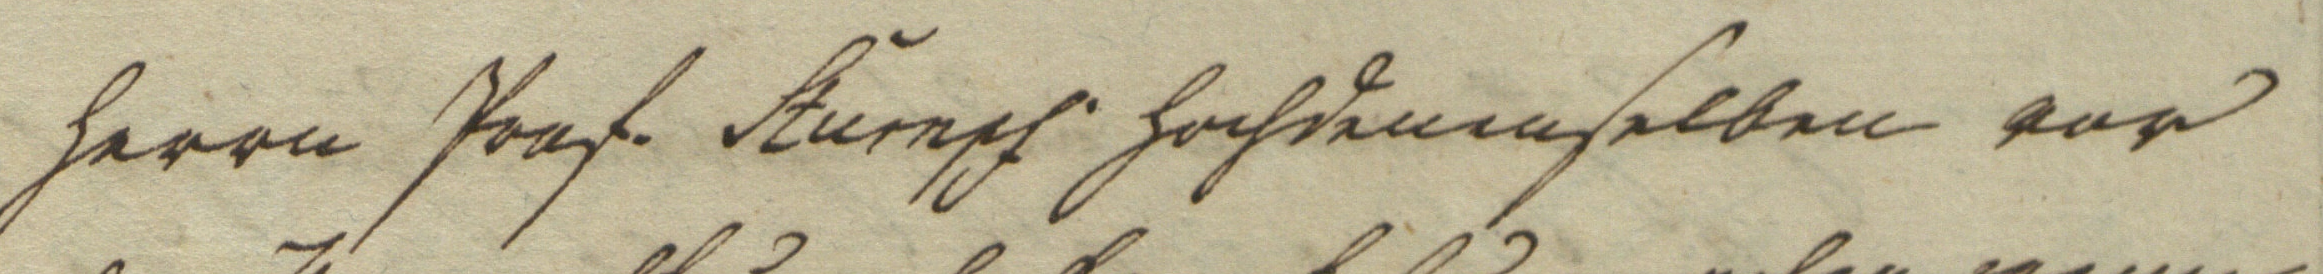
Herrn Prof. Stumpf Hochdenenselben vor
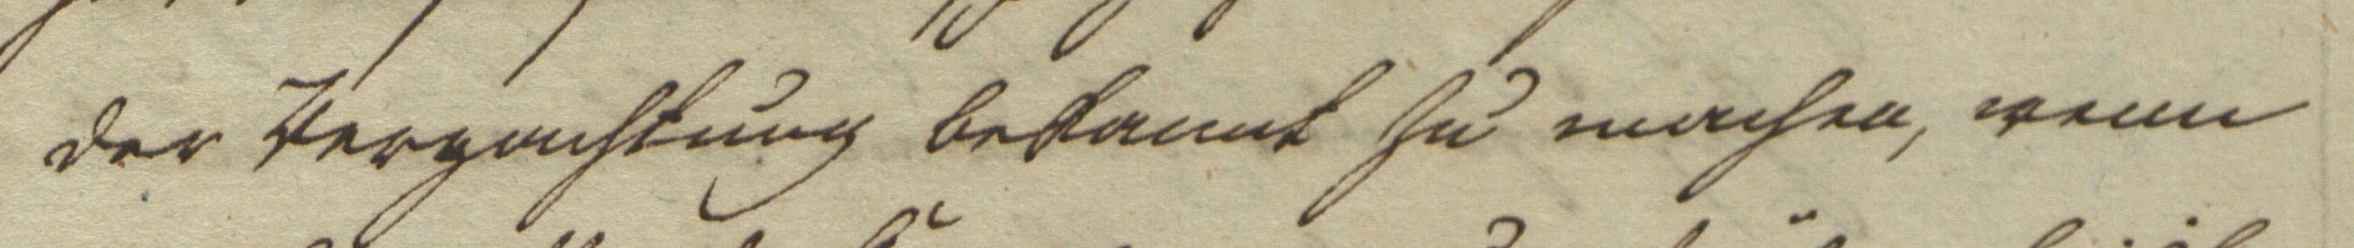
der Verpachtung bekannt zu machen, wenn
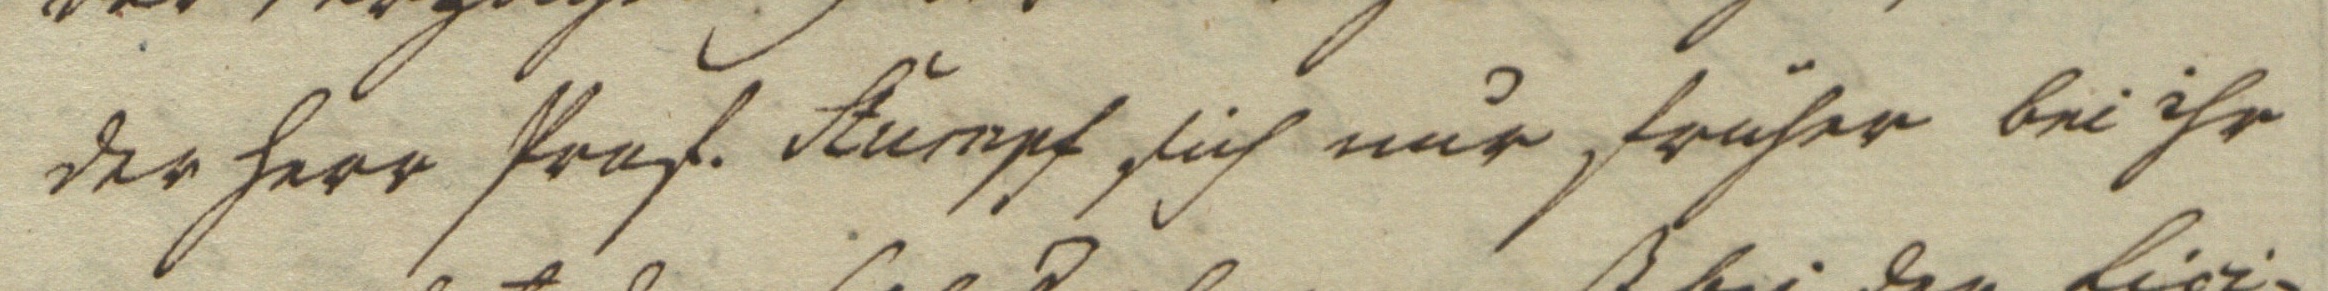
der Herr Prof. Stumpf sich nur früher bei ihr
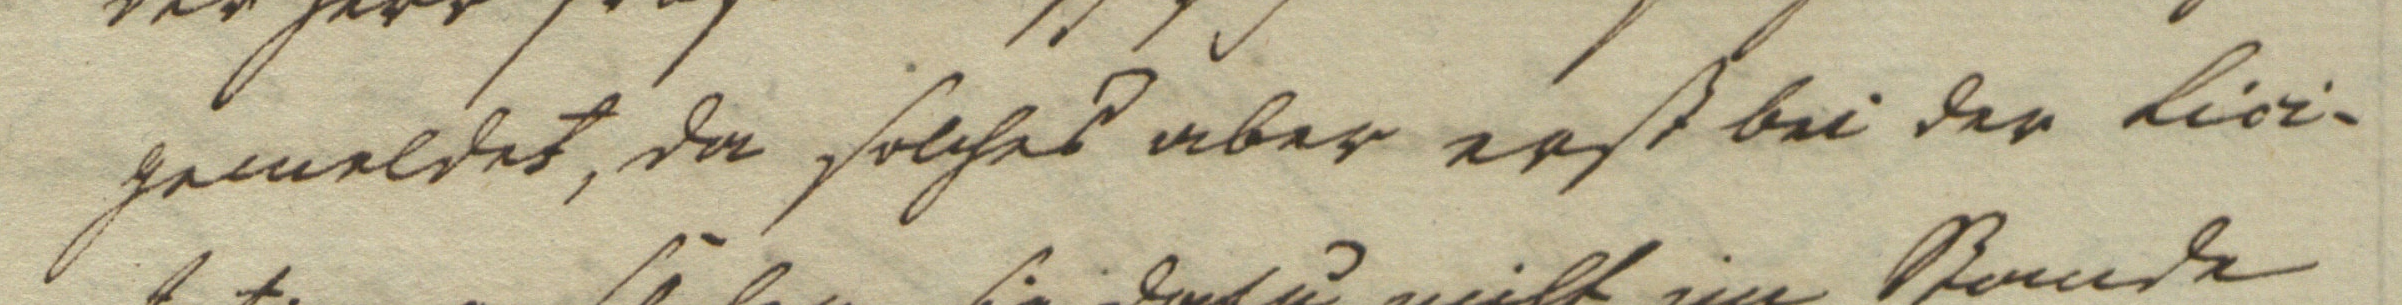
gemeldet, da solches aber erst bei der Lici¬
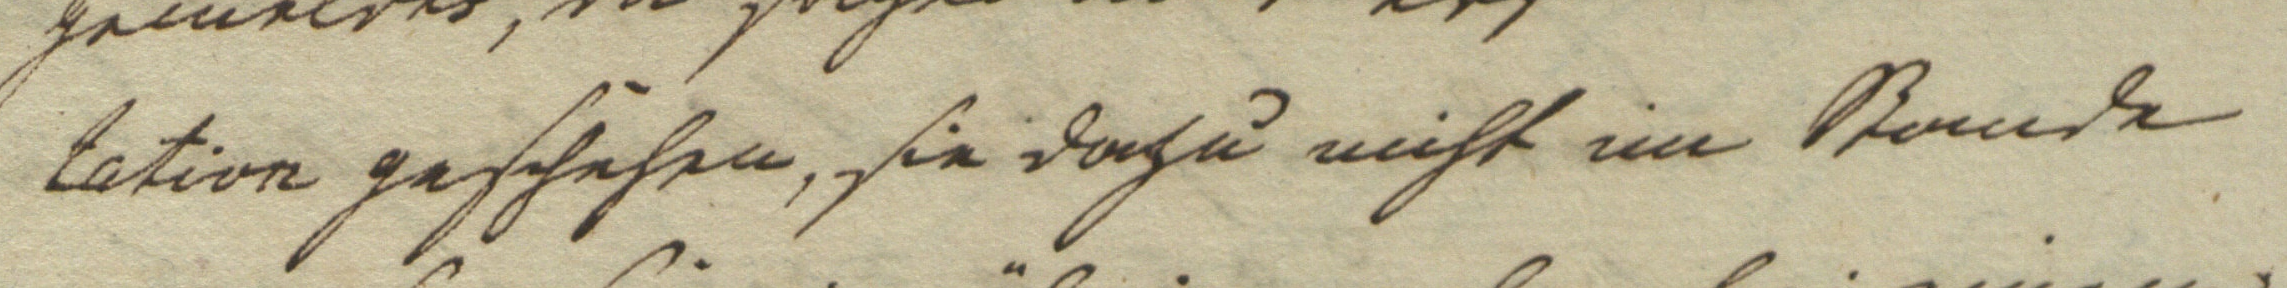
tation geschehen, sie dazu nicht im Stande
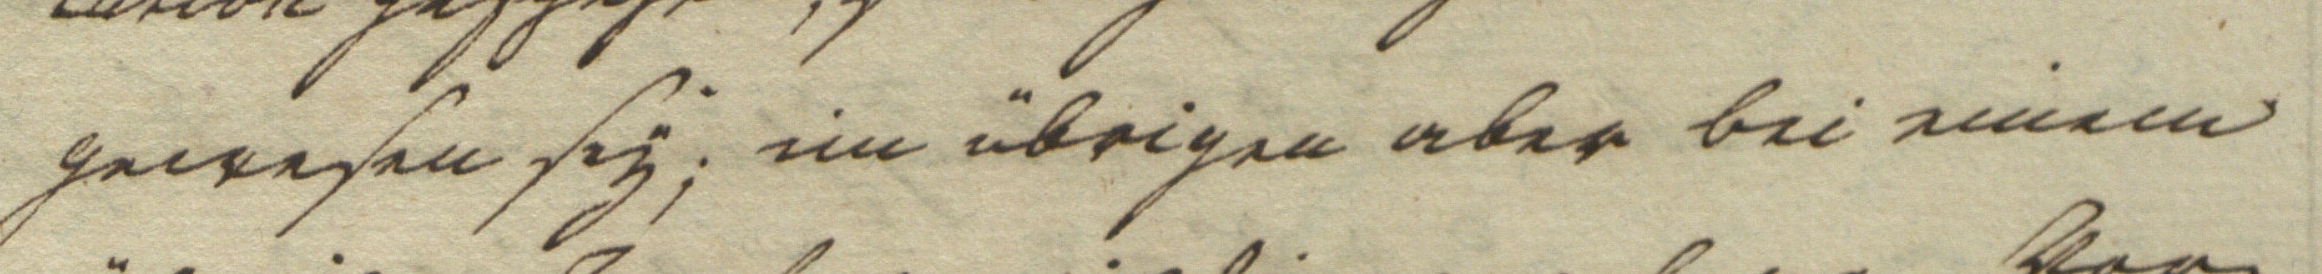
gewesen seÿ; im übrigen aber bei einem
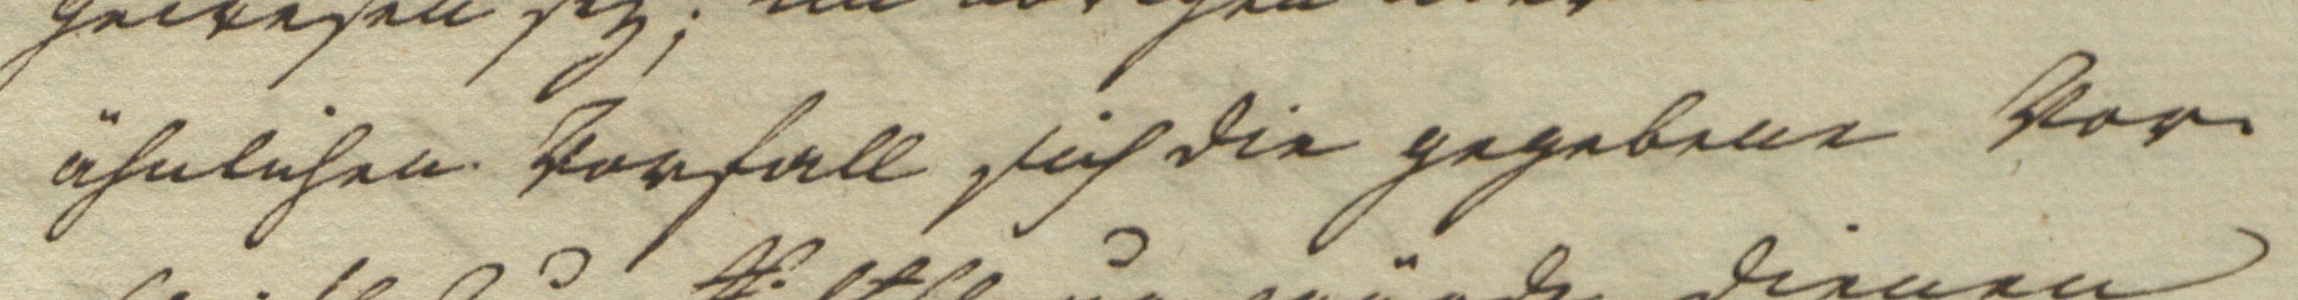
ähnlichen Vorfall sich die gegebene Vor¬
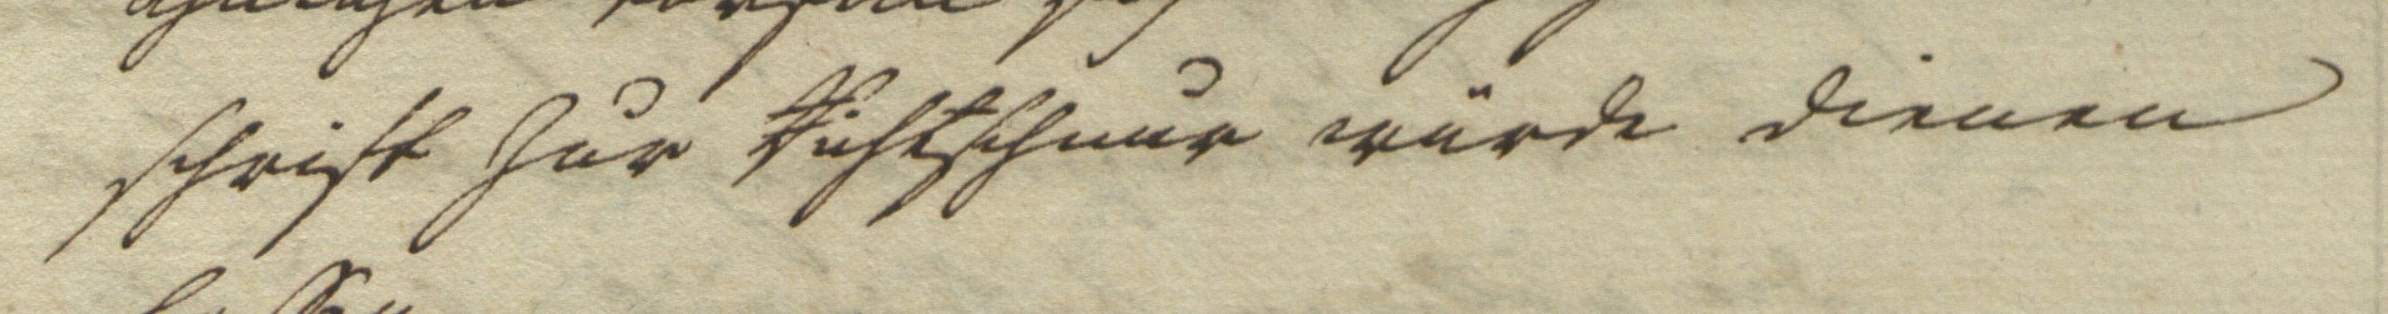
schrift zur Richtschnur würde dienen
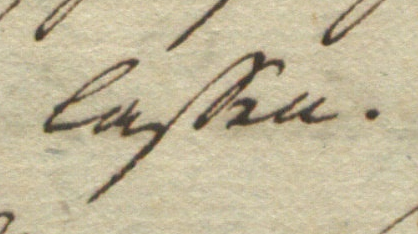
lassen.
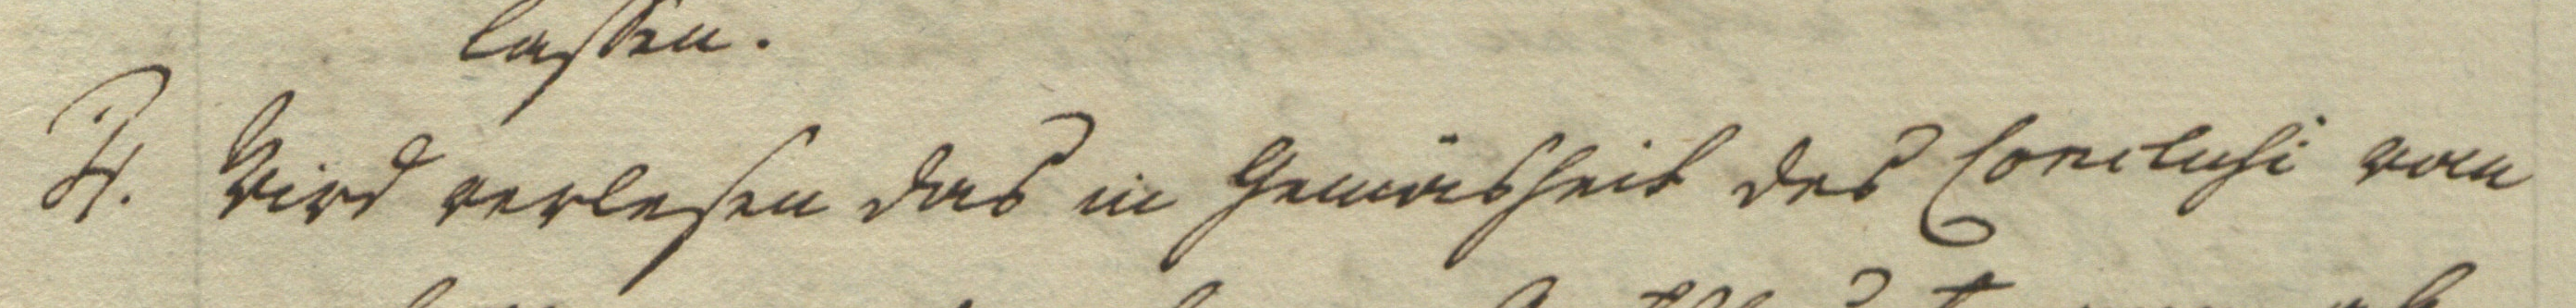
4. Wird verlesen das in Gemäsheit des Conclusi vom
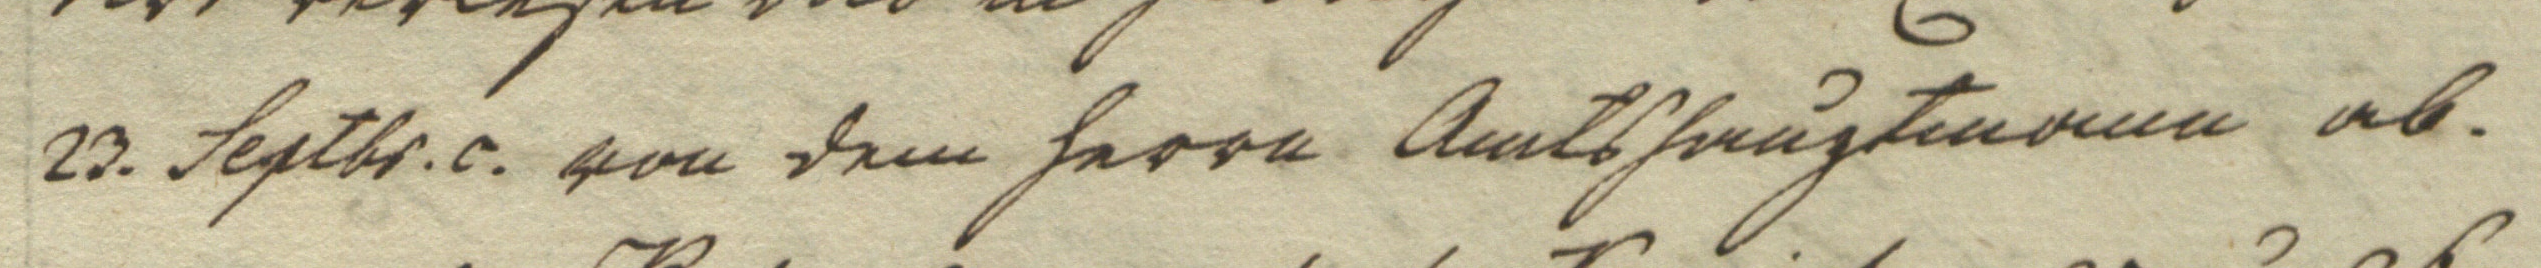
23. Septbr. c. von dem Herrn Amtshauptmann ob¬
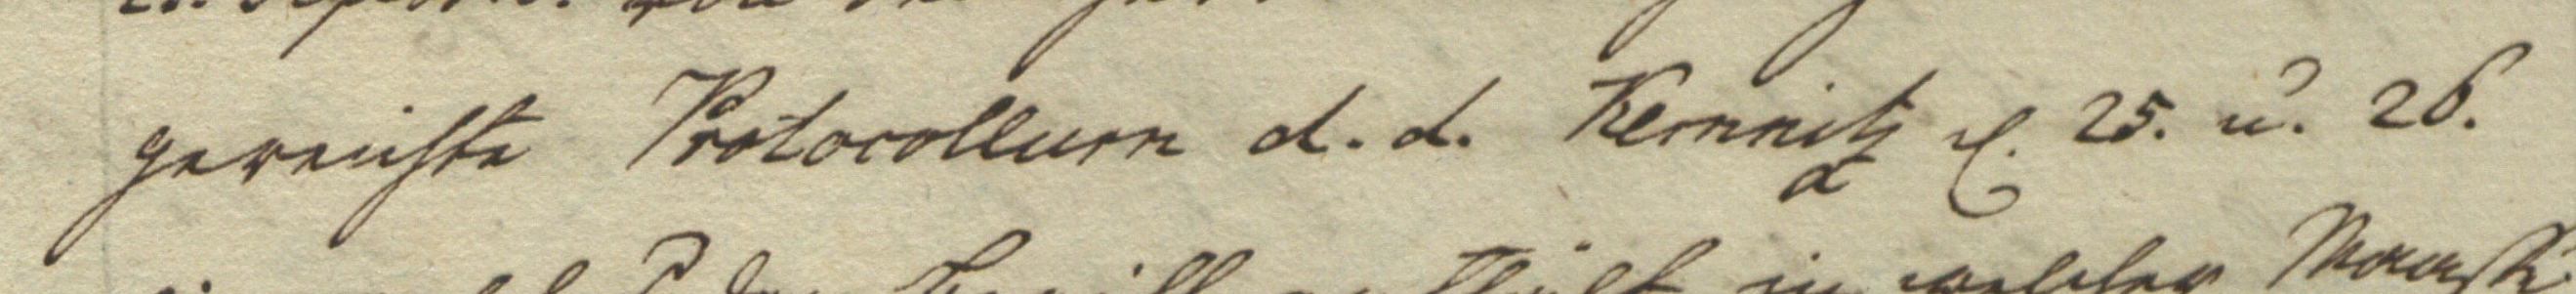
gereichte Protocollum d. d. Kemnitz d. 25. u. 26.
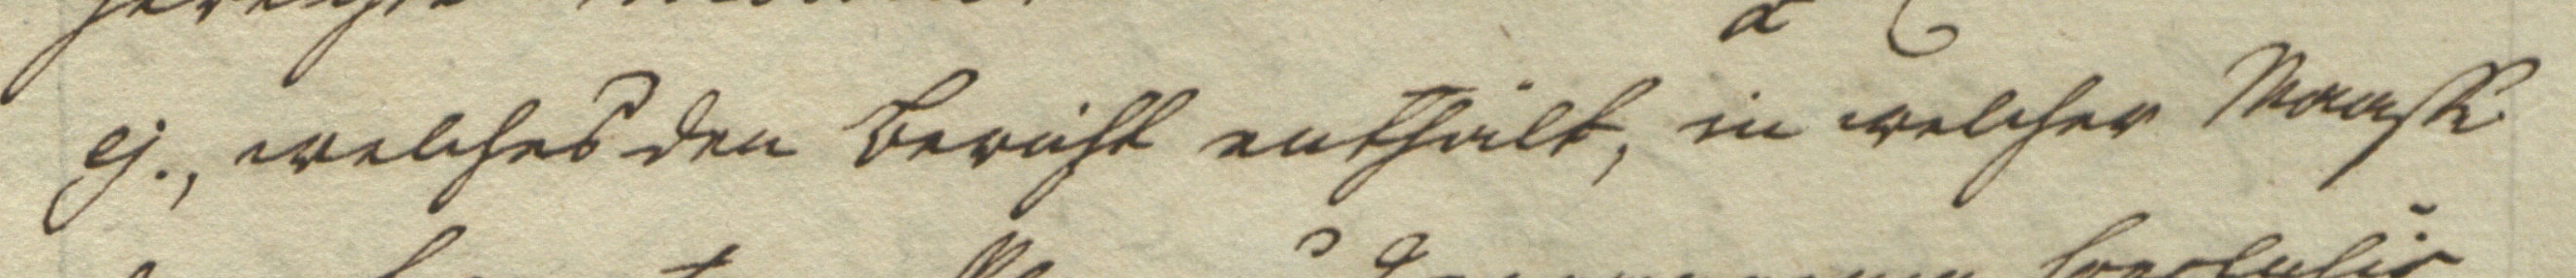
ej., welches den Bericht enthält, in welcher Maaße
